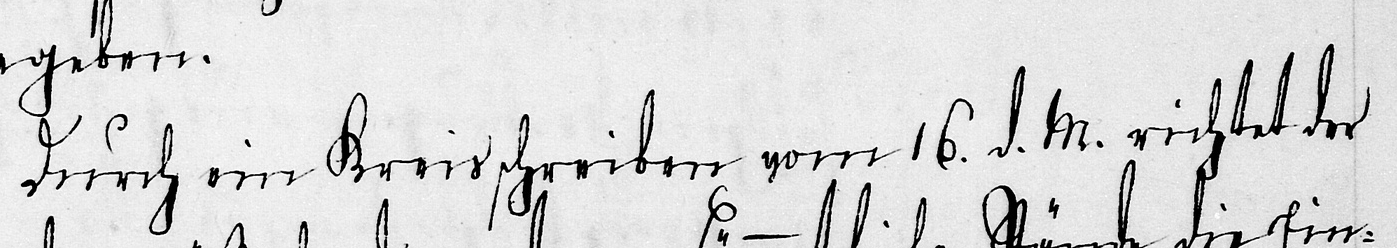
Durch ein Kreisschreiben vom 16. v. M. richtet der
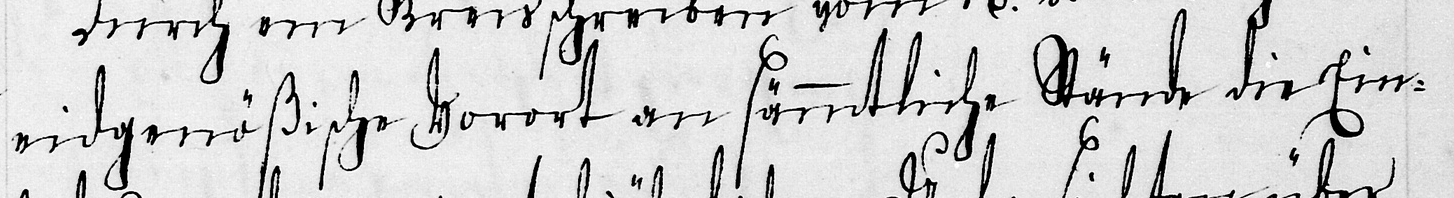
eidgenößische Vorort an sämmtliche Stände die Ein¬
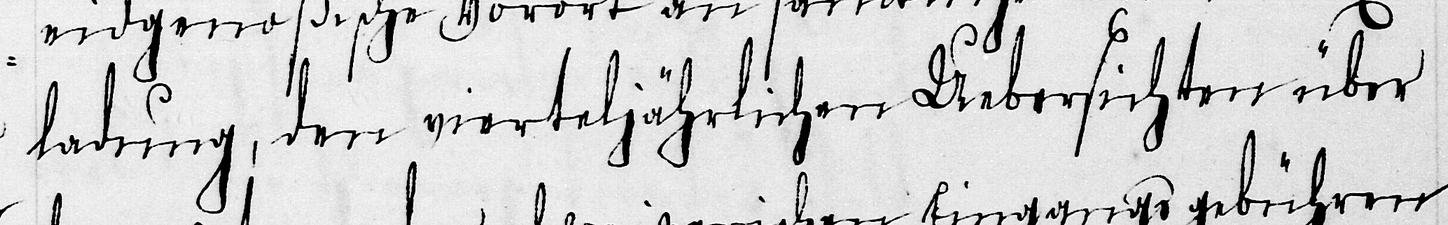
ladung, den vierteljährlichen Uebersichten über
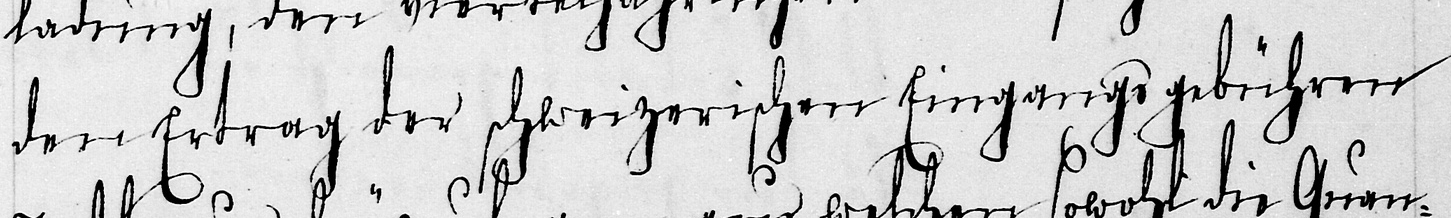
den Ertrag der schweizerischen Eingangsgebühren
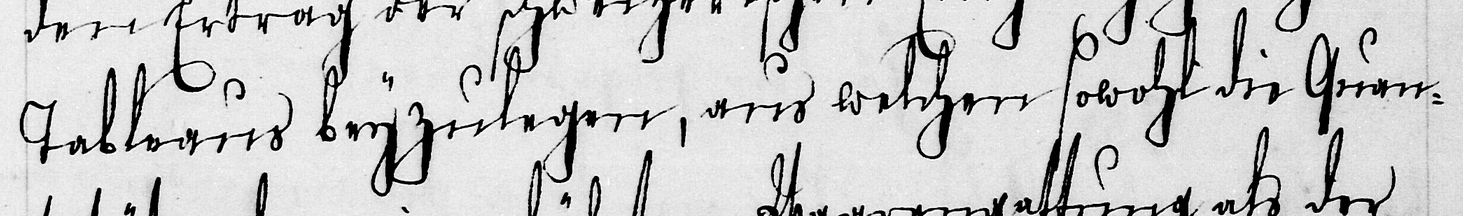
Tableaus beyzulegen, aus welchen sowohl die Quan¬
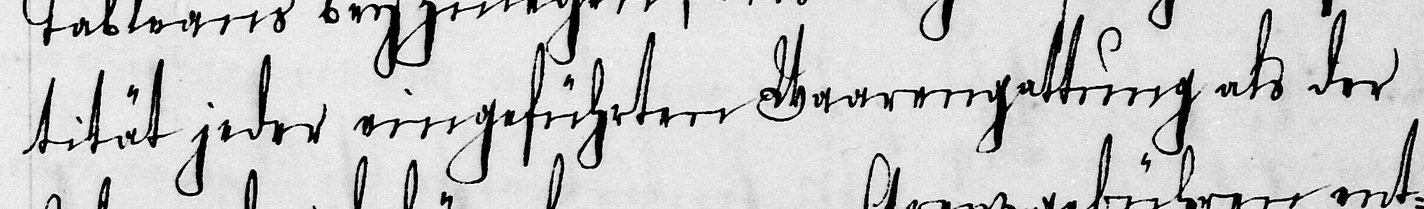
tität jeder eingeführten Waarengattung als der
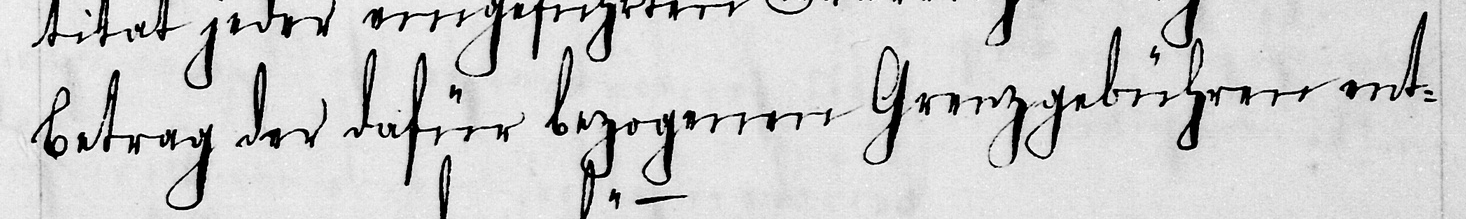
Betrag der dafür bezogenen Grenzgebühren ent¬
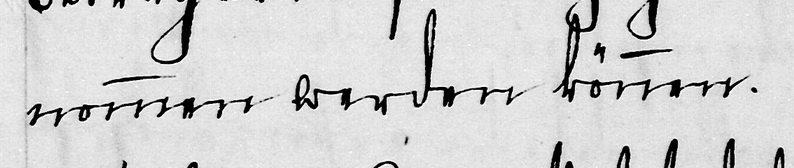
nommen werden können.
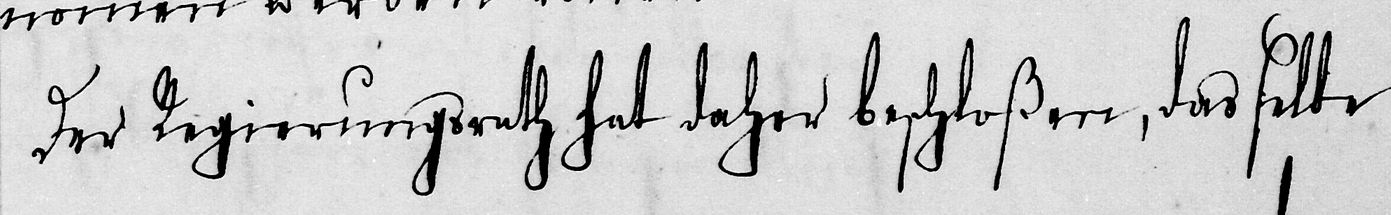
Der Regierungsrath hat daher beschloßen, das selbe
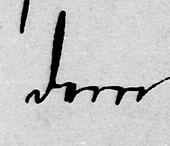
dem
